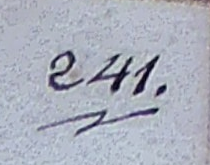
241.
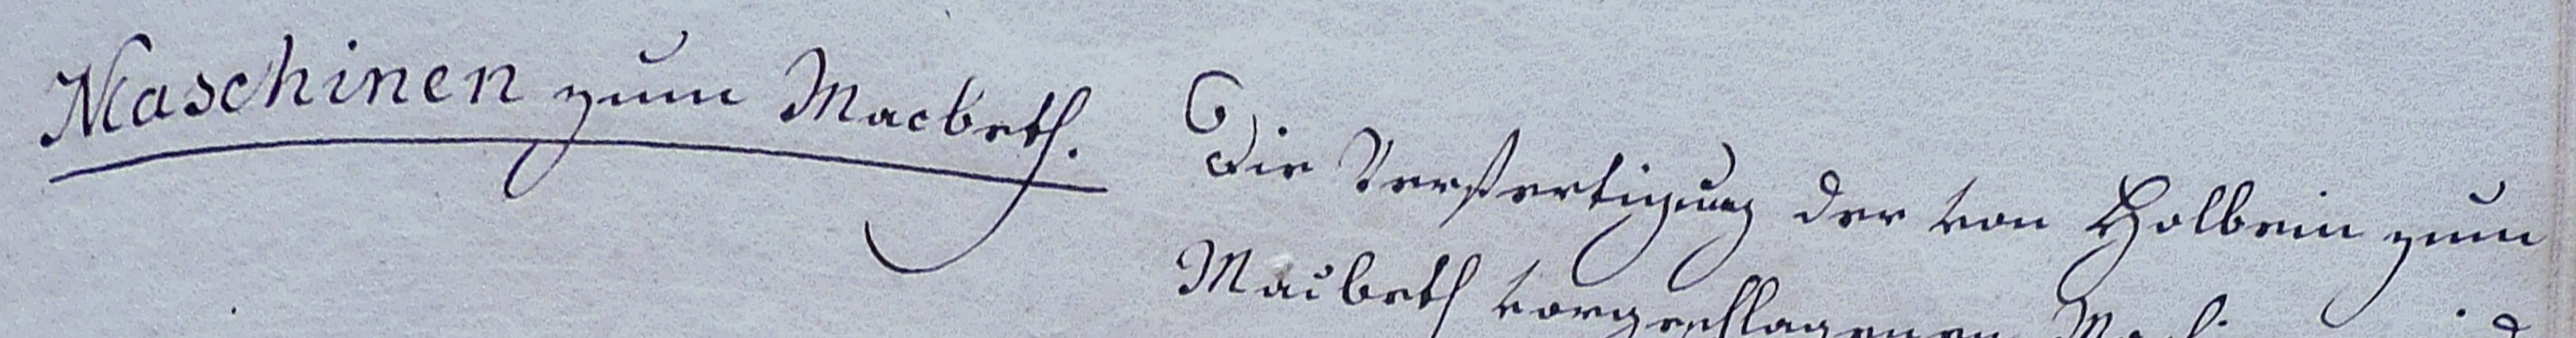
Maschinen zum Macbeth. Die Verfertigung der von Holbein zum
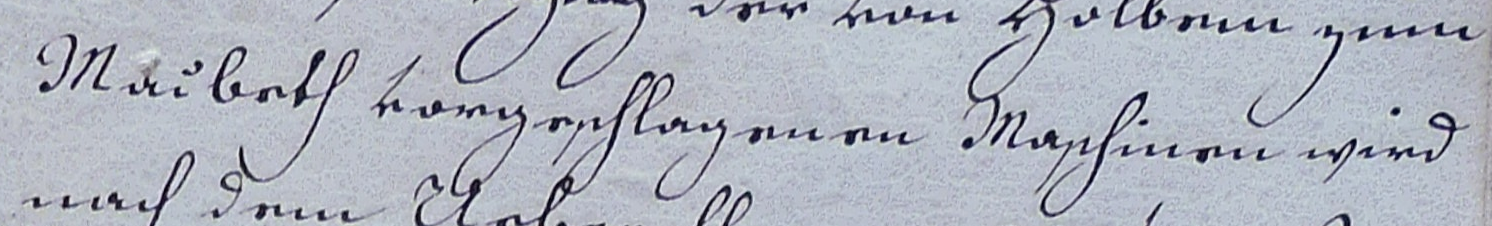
Macbeth vorgeschlagenen Maschinen wird
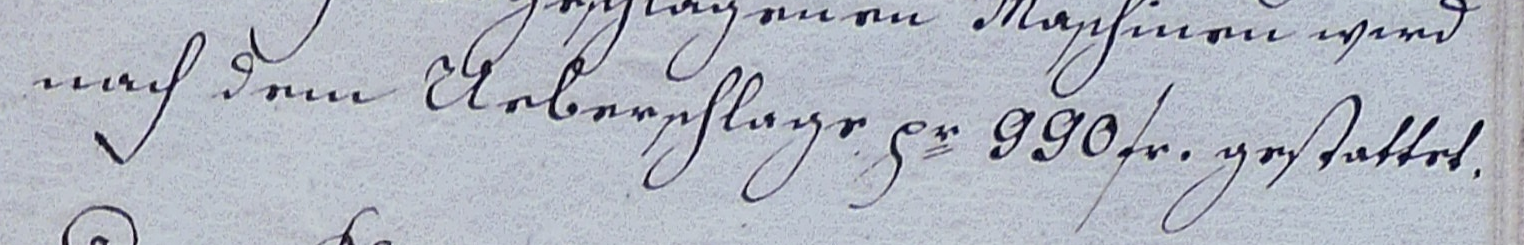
nach dem Ueberschlage pr͇ 990fr. gestattet.
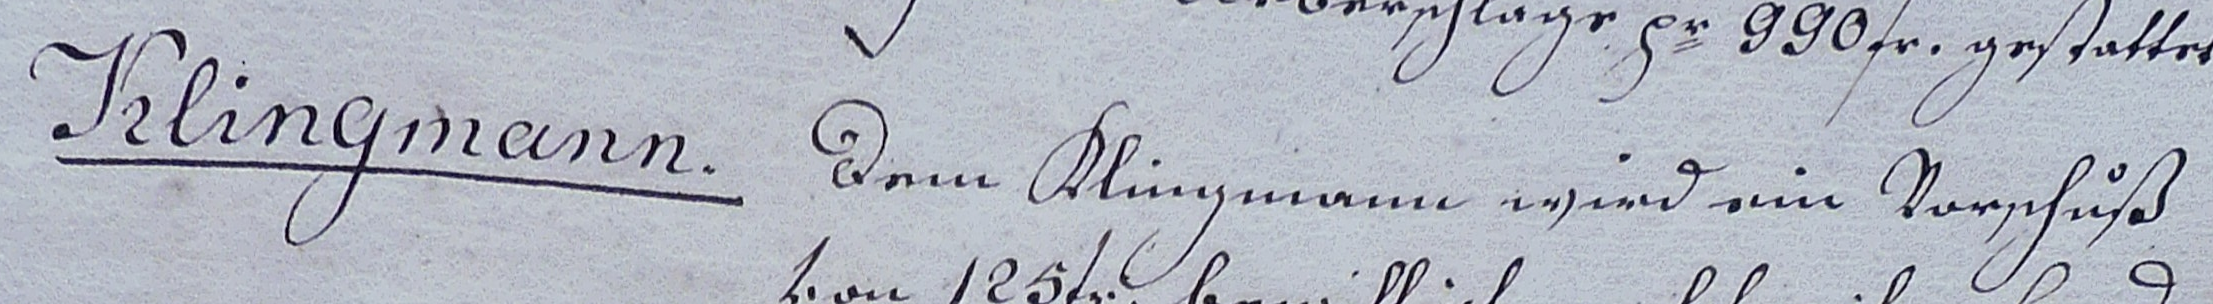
Klingmann. Dem Klingmann wird ein Vorschuß
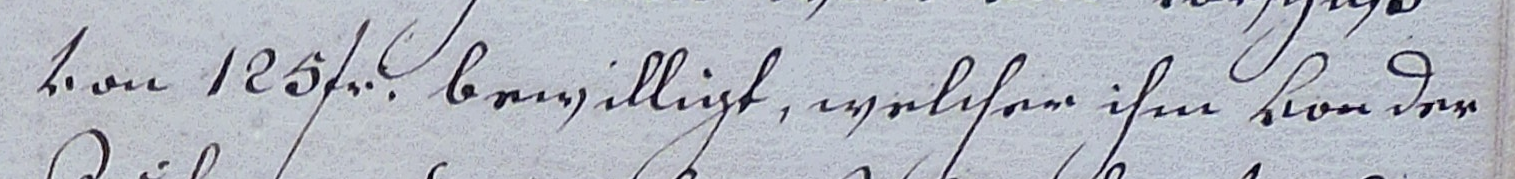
von 125fr. bewilligt, welcher ihm von der
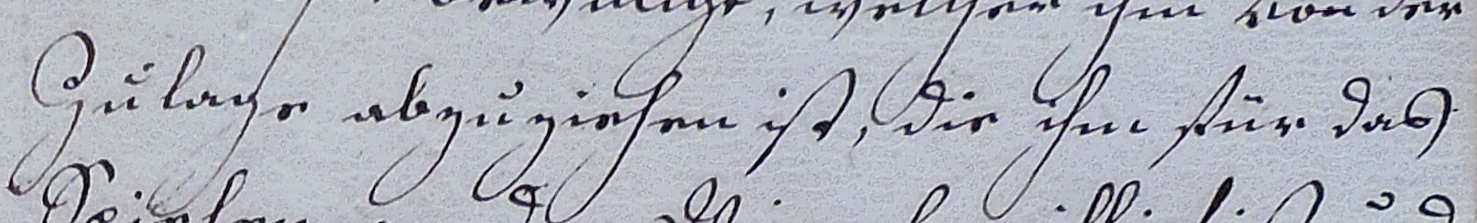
Zulage abzuziehen ist, die ihm für das
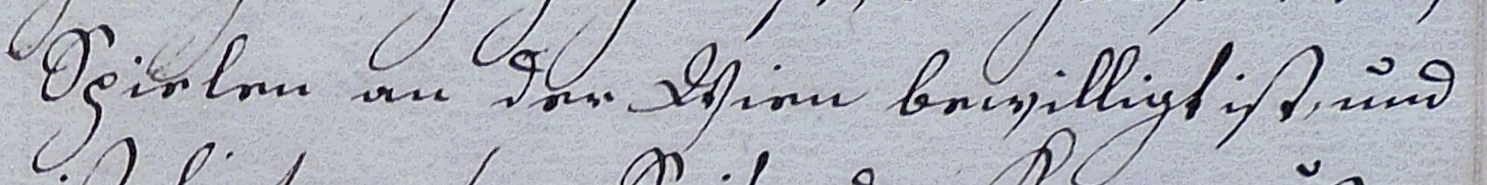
Spielen an der Wien bewilligt ist, und
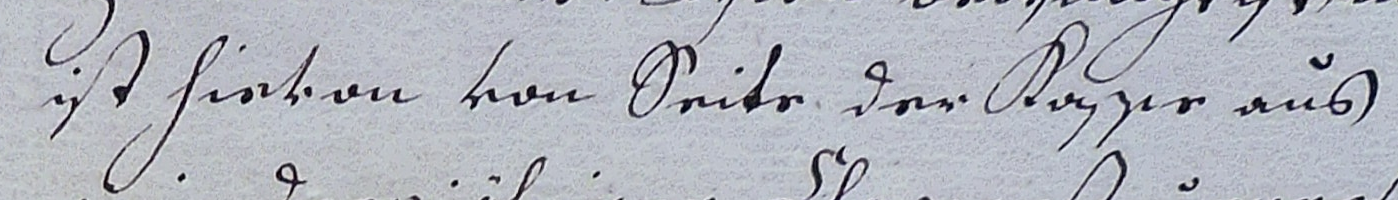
ist hievon von Seite der Kasse aus
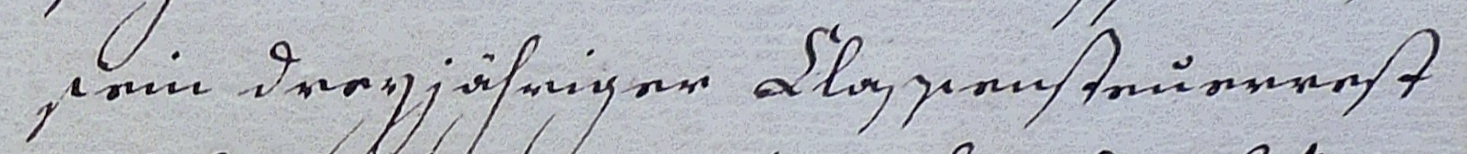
sein dreyjähriger Classensteuerrest
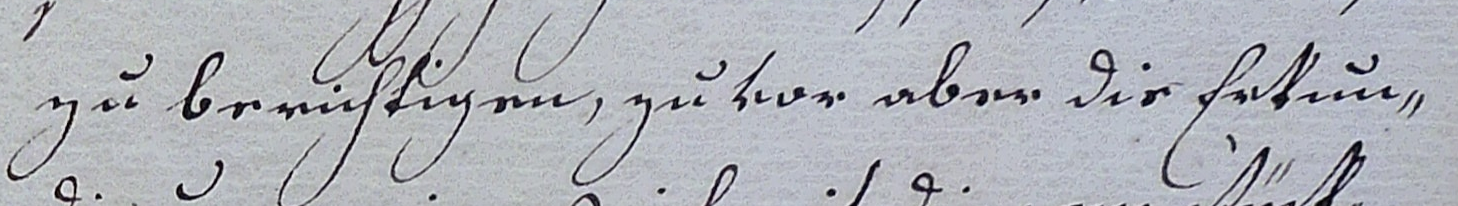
zu berichtigen, zu vor aber die Erkun¬
